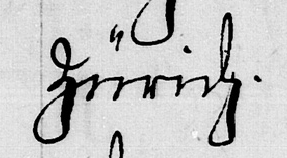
Zürich.
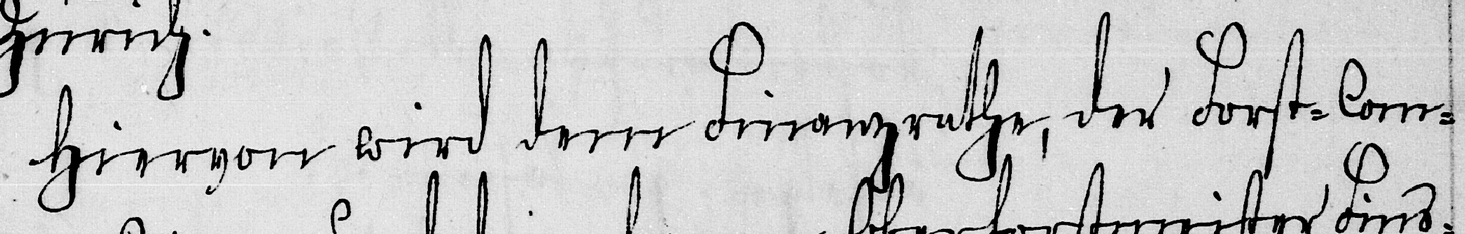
Hiervon wird dem Finanzrathe, der Forst-Com¬
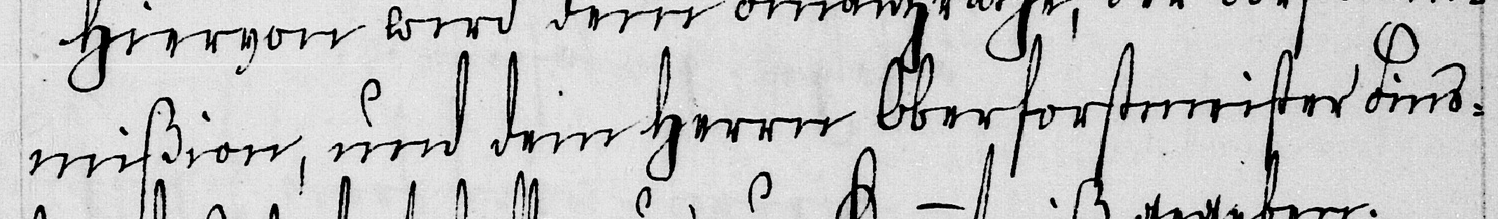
mißion, und dem Herrn Oberforstmeister Fins¬
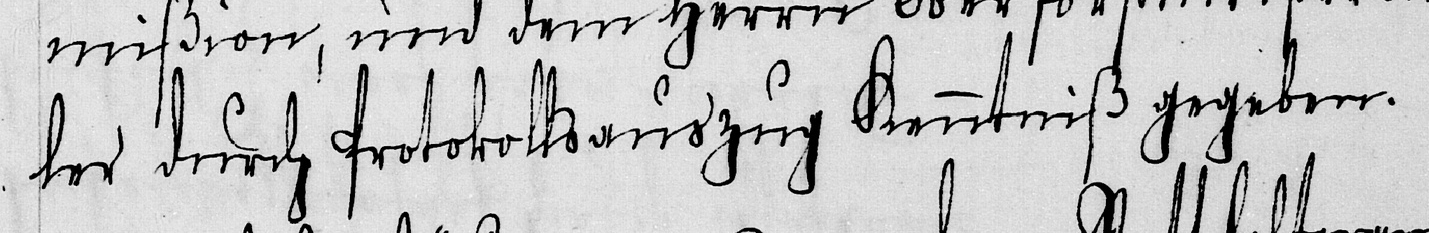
ler durch Protokollsauszug Kenntniß gegeben.
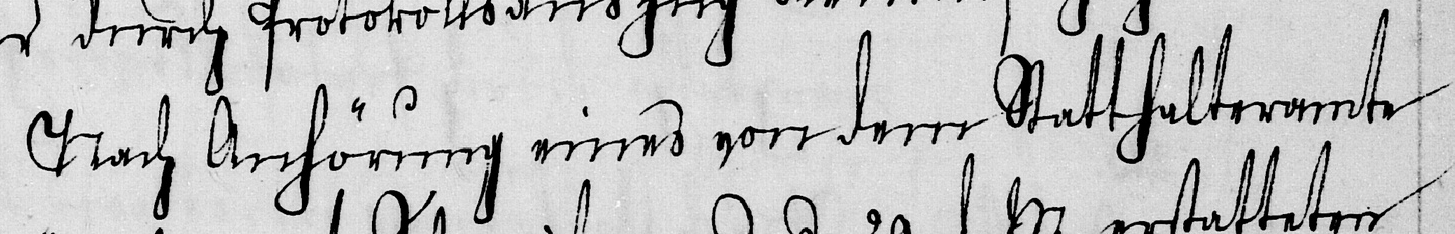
Nach Anhörung eines von dem Statthalteramte
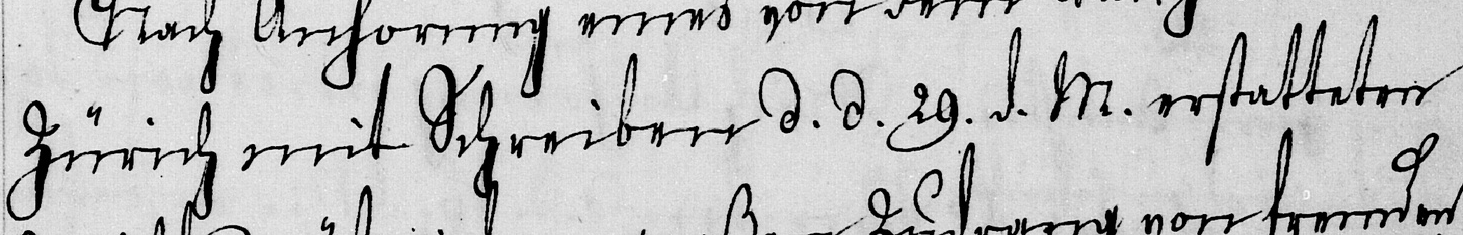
Zürich mit Schreiben d. d. 29. v. M. erstatteten
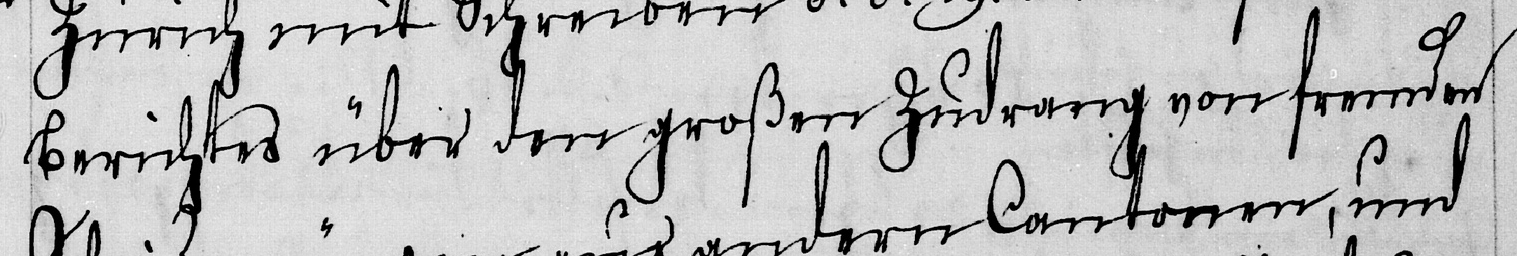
Berichtes über den großen Zudrang von fremden
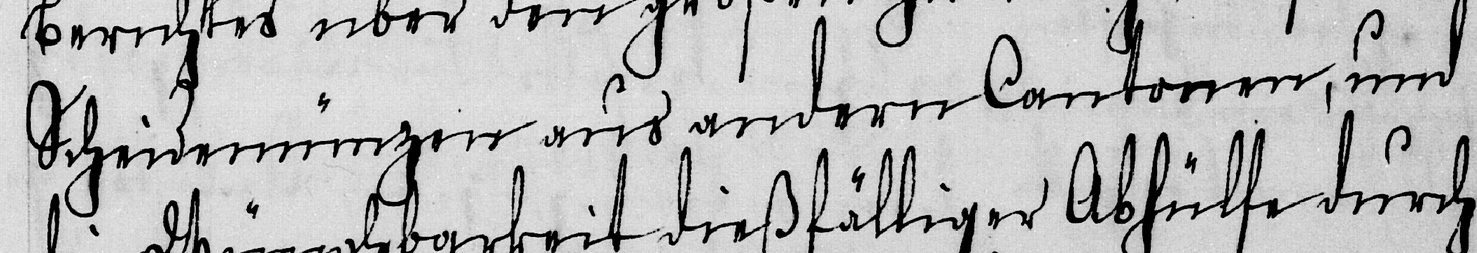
Scheidemünzen aus andern Cantonen, und
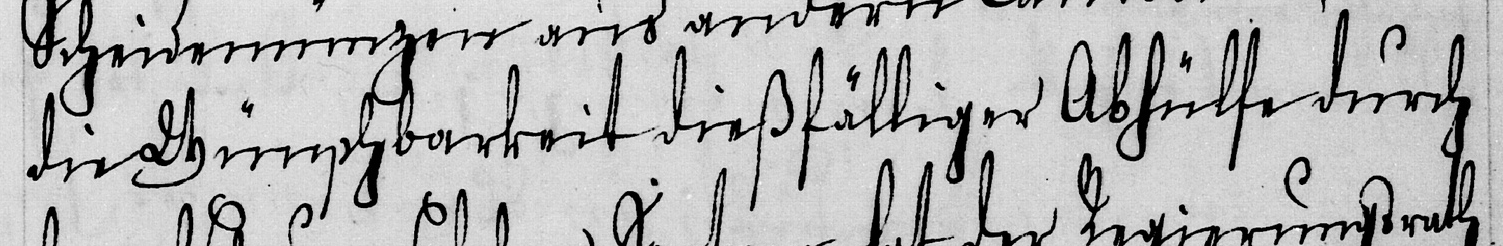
die Wünschbarkeit dießfälliger Abhülfe durch
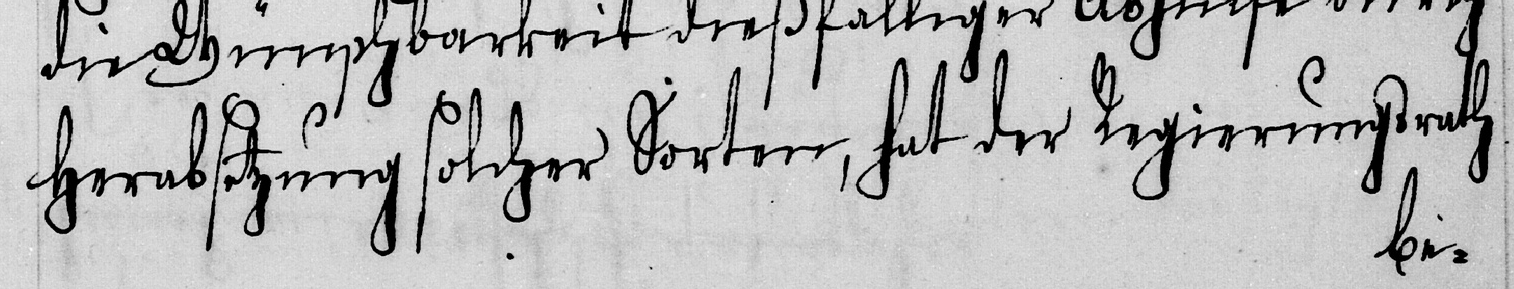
Herabsetzung solcher Sorten, hat der Regierungsrath
